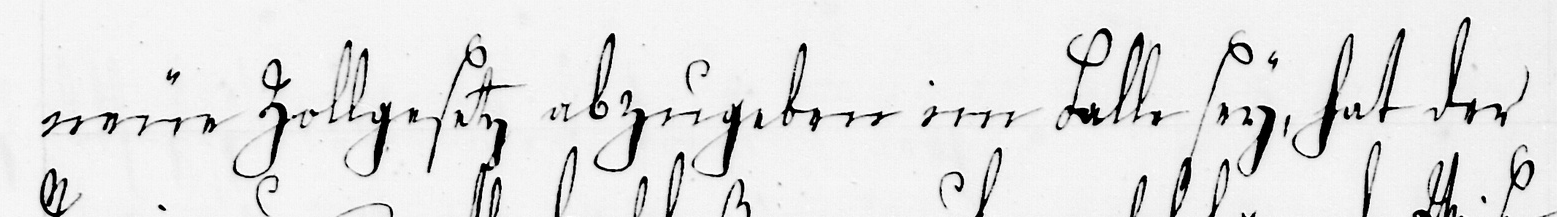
neue Zollgesetz abzugeben im Falle sey, hat der
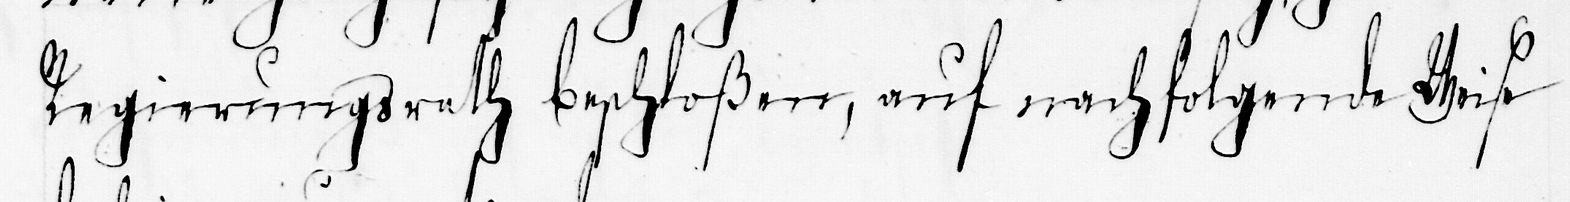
Regierungsrath beschloßen, auf nachfolgende Weise
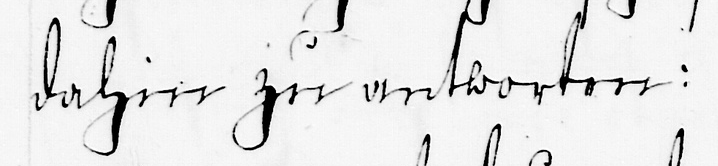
dahin zu antworten:
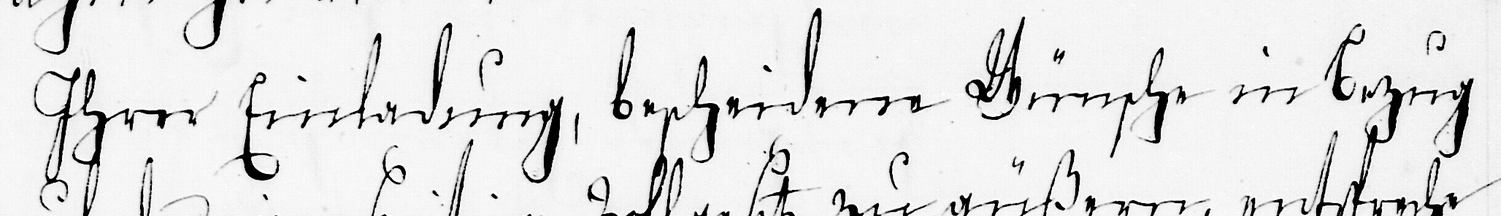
Ihrer Einladung, bescheidene Wünsche in Bezug
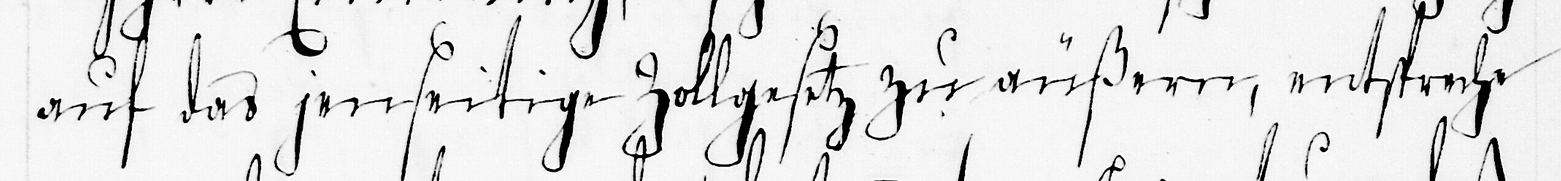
auf das jenseitige Zollgesetz zu äußern, entspreche
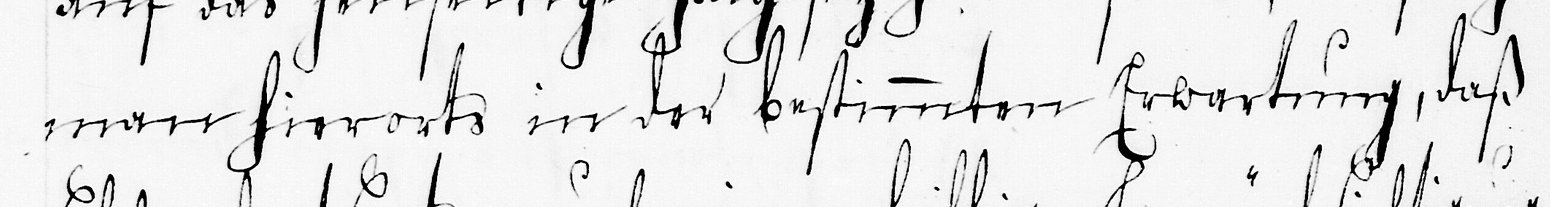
man hierorts in der bestimmten Erwartung, daß
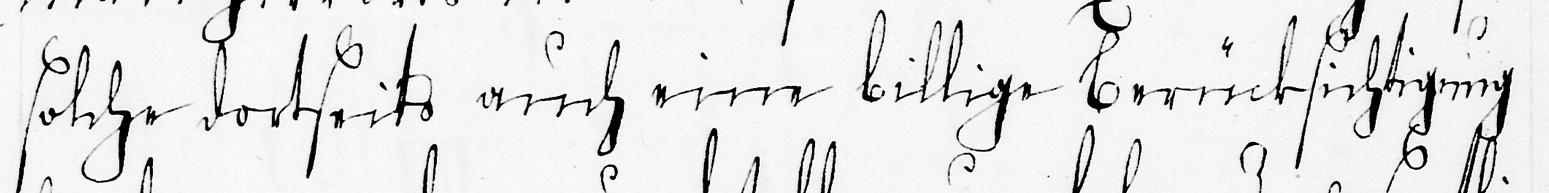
solche dortseits auch eine billige Berücksichtigung
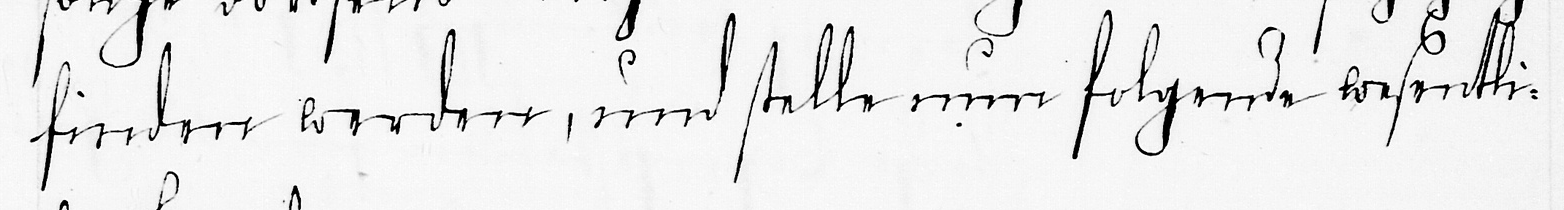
finden werden, und stelle nun folgende wesentli¬
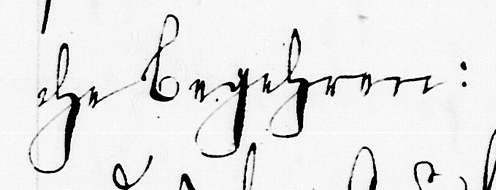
che Begehren:
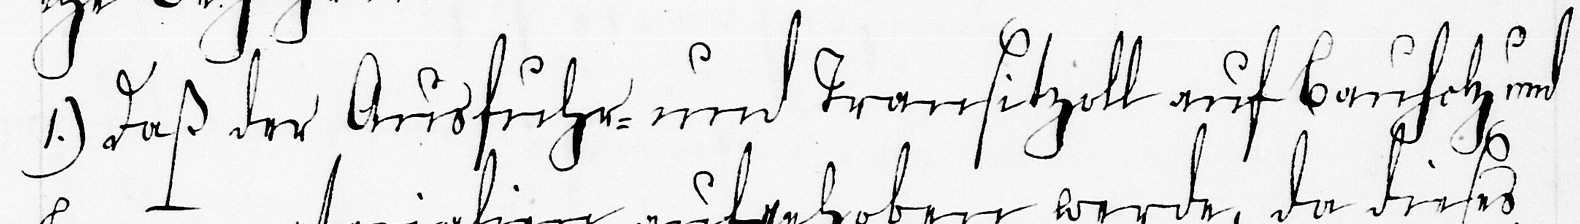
1.) Daß der Ausfuhr- und Transitzoll auf Bauholz und
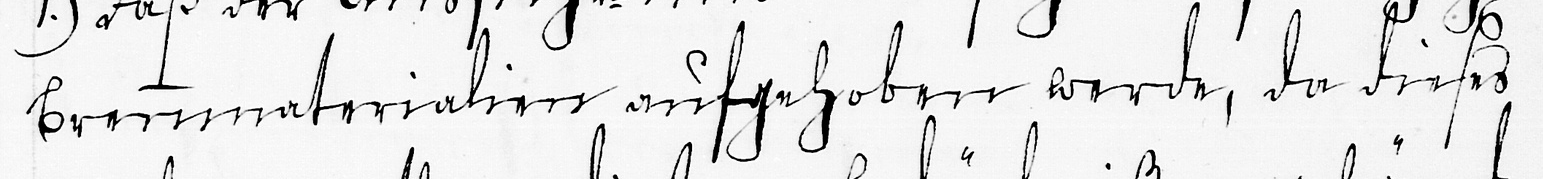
Brennmaterialien aufgehoben werde, da dieses
